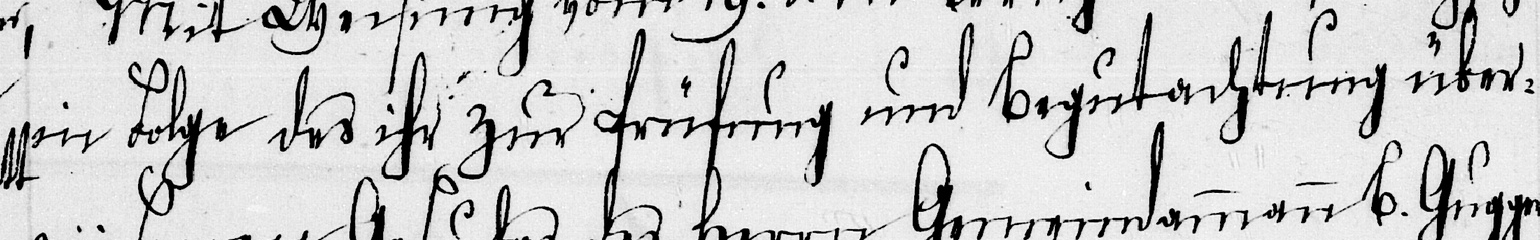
in Folge des ihr zur Prüfung und Begutachtung über¬
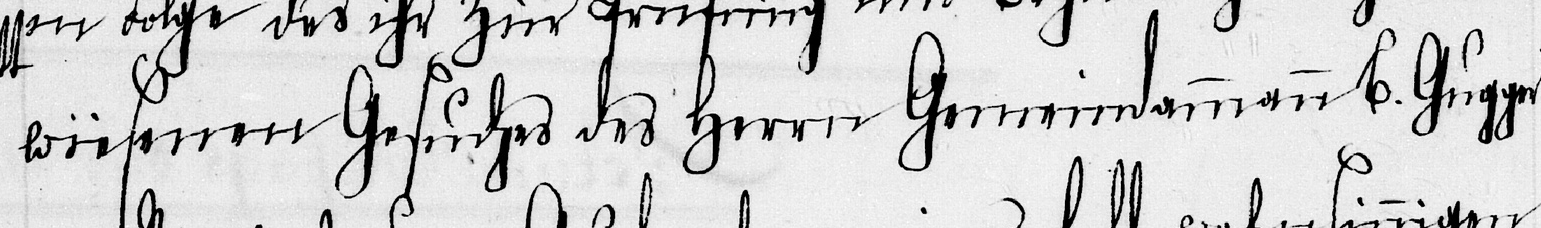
wiesenen Gesuches des Herrn Gemeindammann B. Gug¬
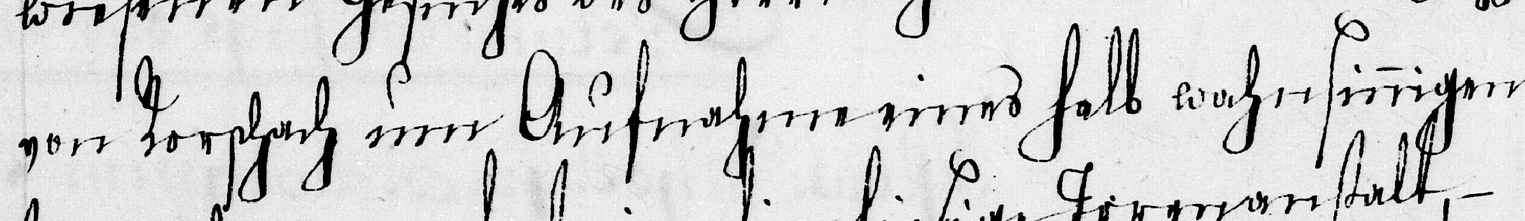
von Rorschach um Aufnahme eines halb wahnsinnigen
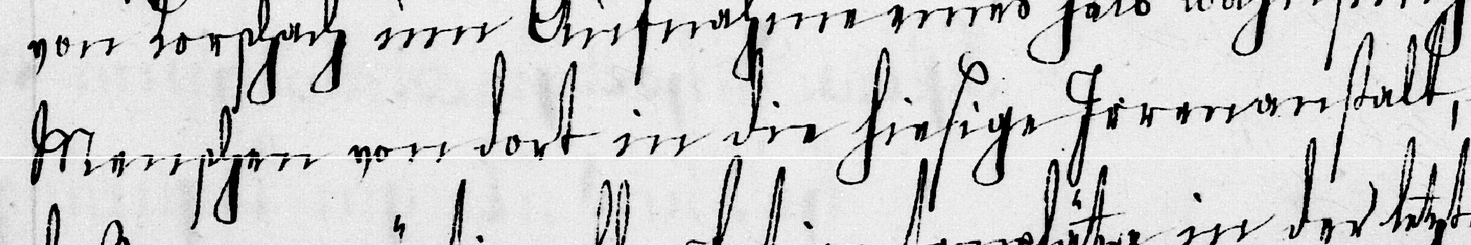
Menschen von dort in die hiesige Irrrenanstalt,
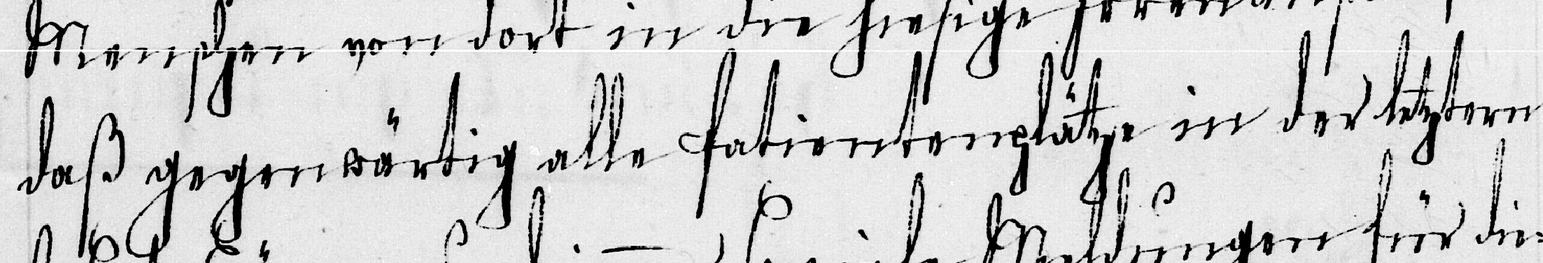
daß gegenwärtig alle Patientenplätze in der letztern
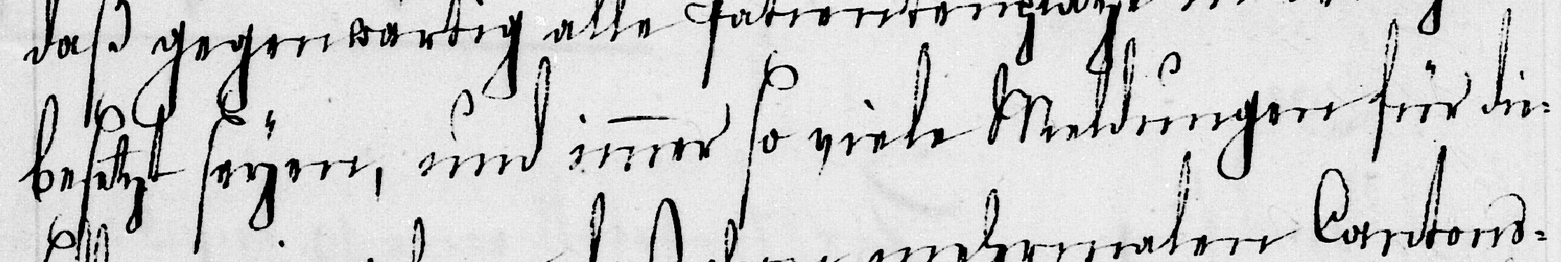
besetzt seyen, und immer so viele Meldungen für die¬
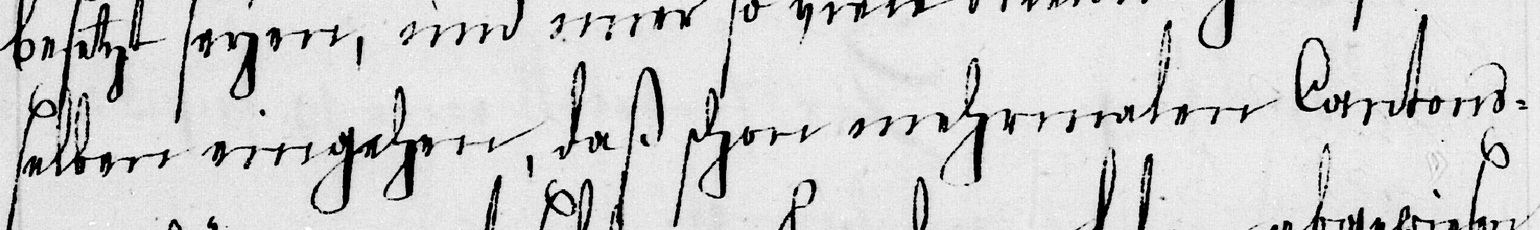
selben eingehen, daß schon mehrmalen Cantons¬
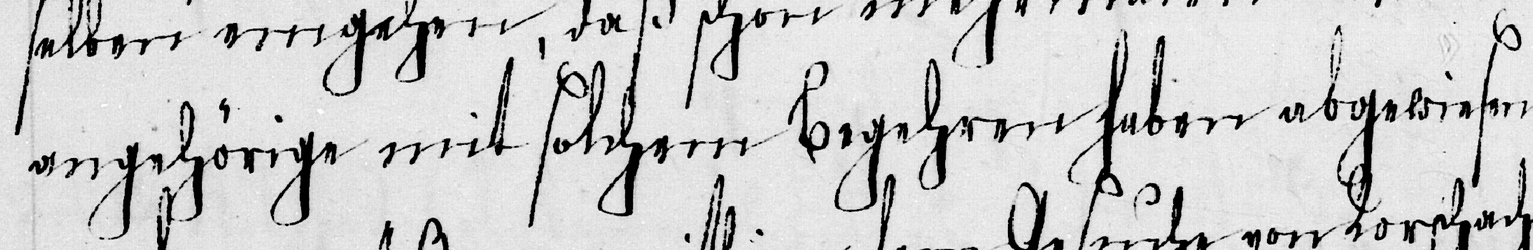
angehörige mit solchem Begehren haben abgewiesen
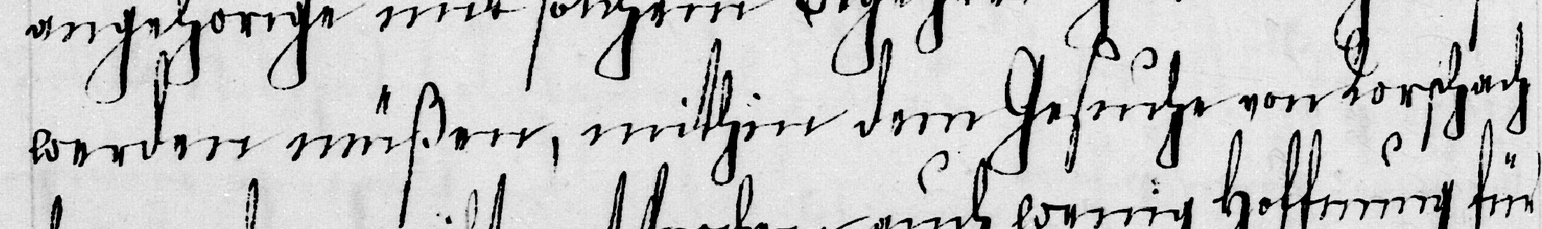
werden müßen, mithin dem Gesuche von Rorschach
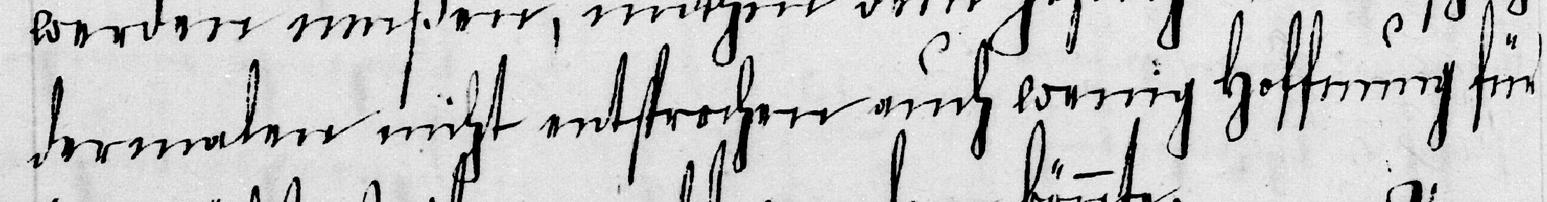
dermalen nicht entsprochen auch wenig Hoffnung für
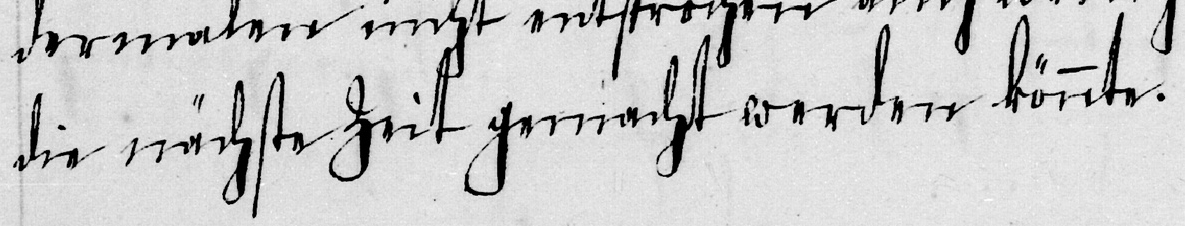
die nächste Zeit gemacht werden könnte.
